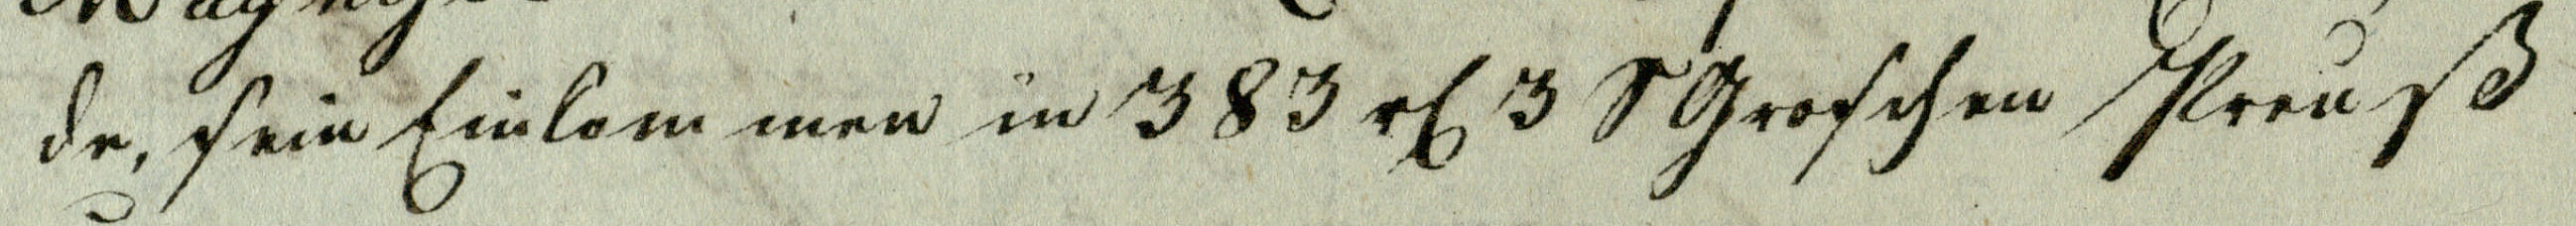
de sein Einkommen in 383 r 3 SGroschen Preuß
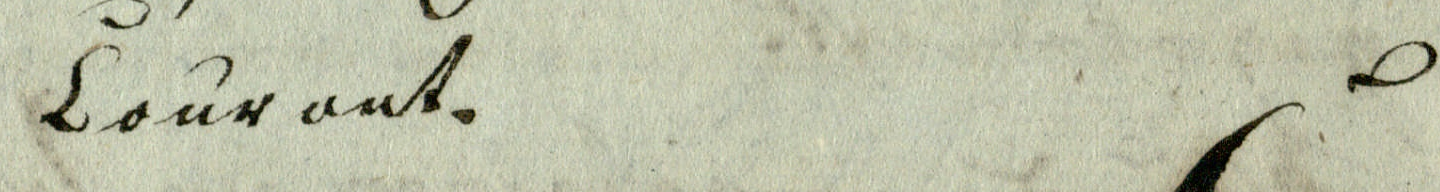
Courant.
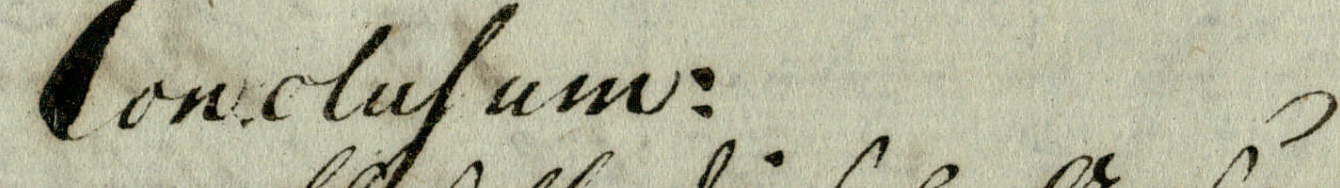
Conclusum:
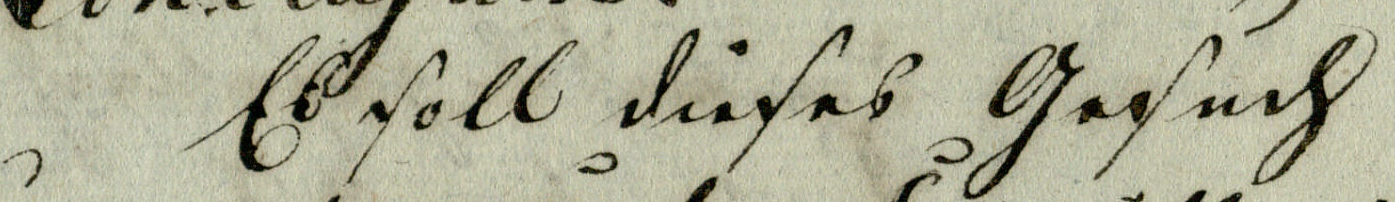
Es soll dieses Gesuch
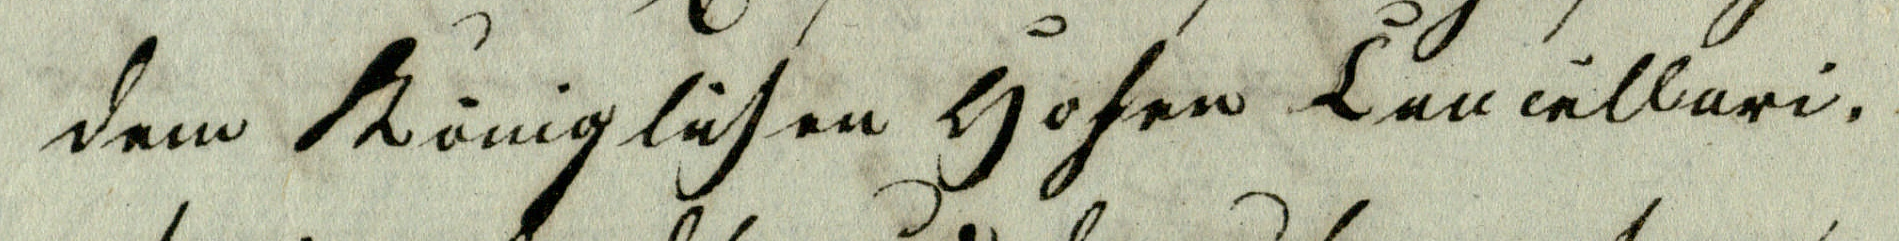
dem Königlichen Hohen Cancellari¬
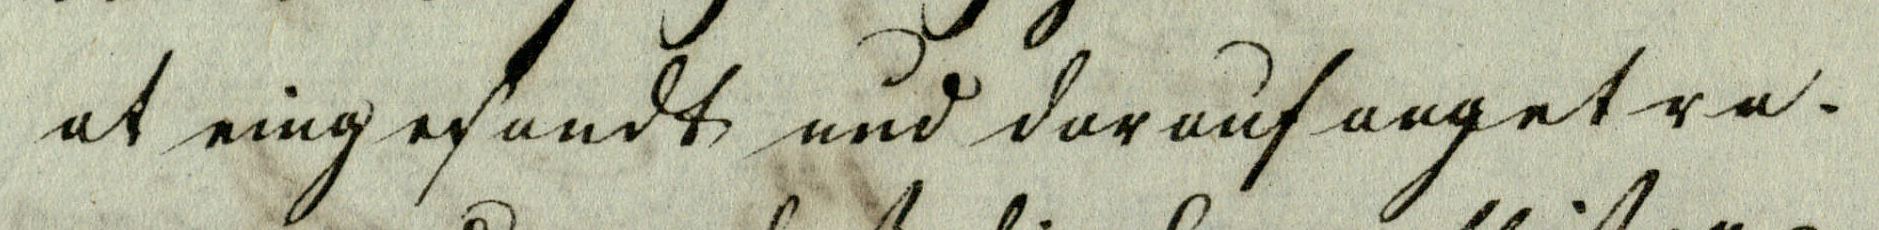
at eingesandt und darauf angetra¬
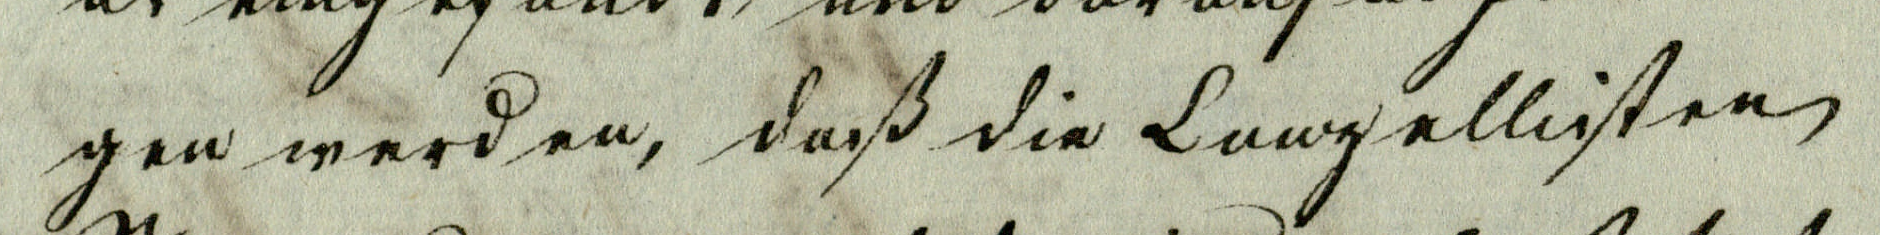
gen werden, daß die Cancellisten
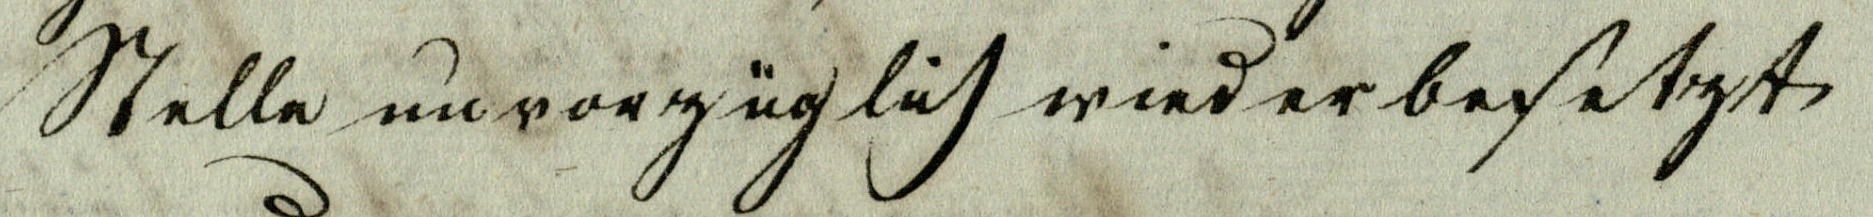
Stelle unverzüglich wiederbesetzt
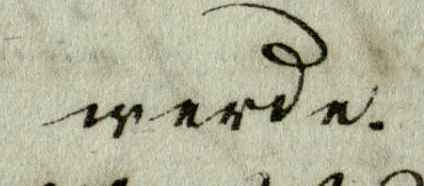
werde.
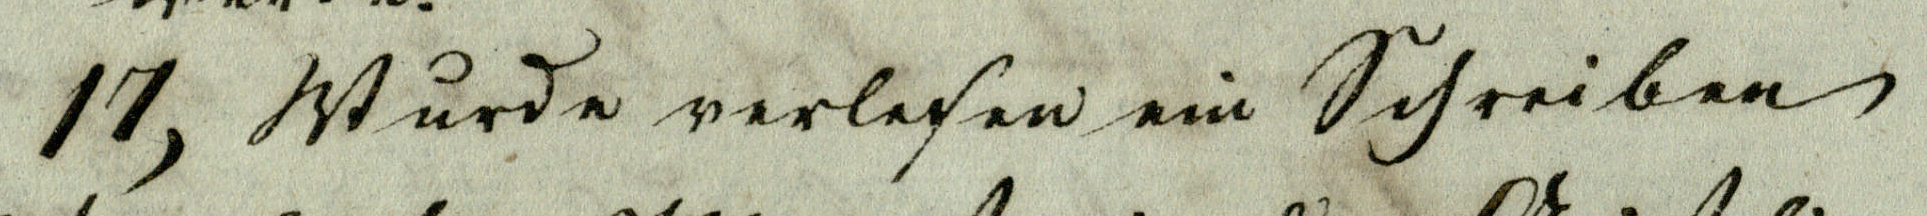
17, Wurde verlesen ein Schreiben
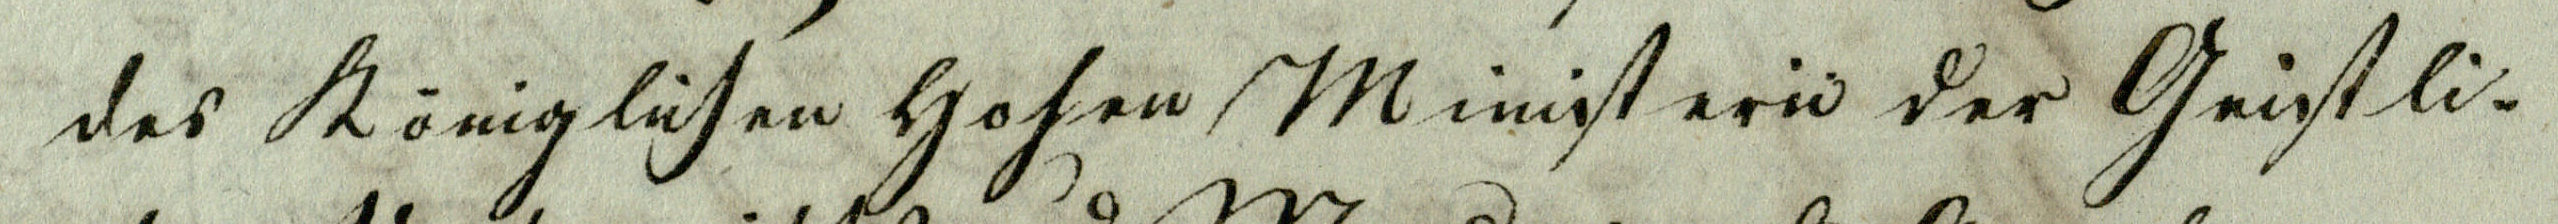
des Königlichen Hohen Ministerii der Geistli¬
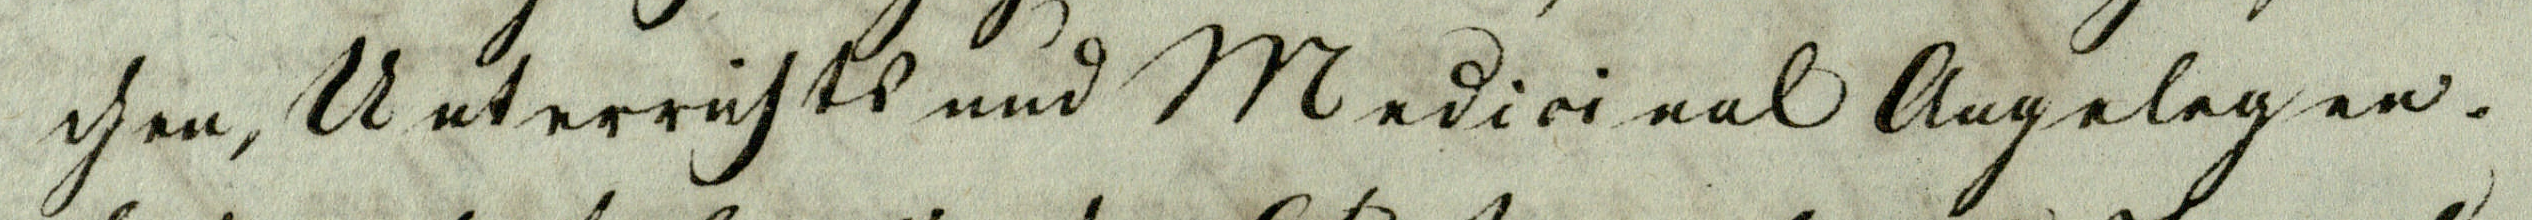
chen Unterrichts und Medicinal Angelegen¬
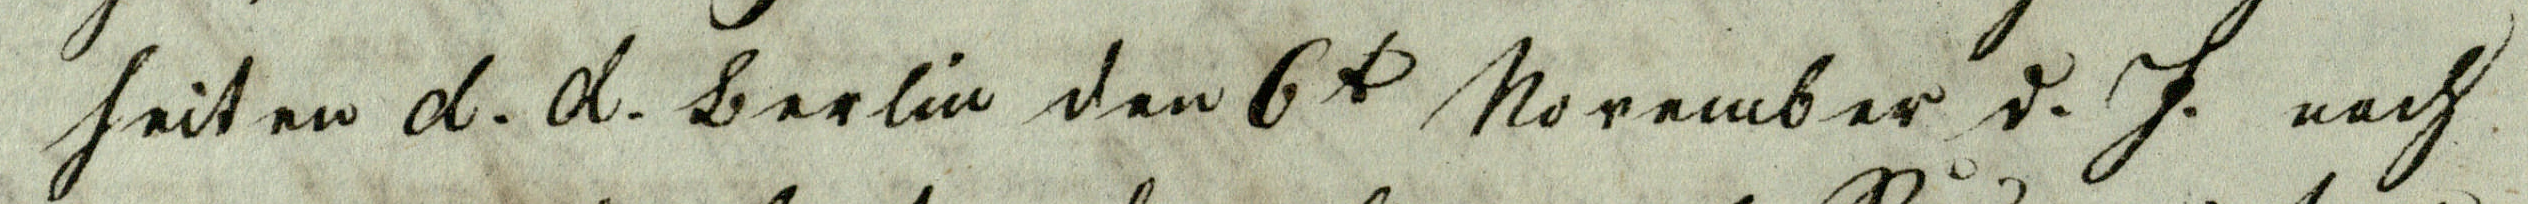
heiten d. d. Berlin den 6t November d. J. nach
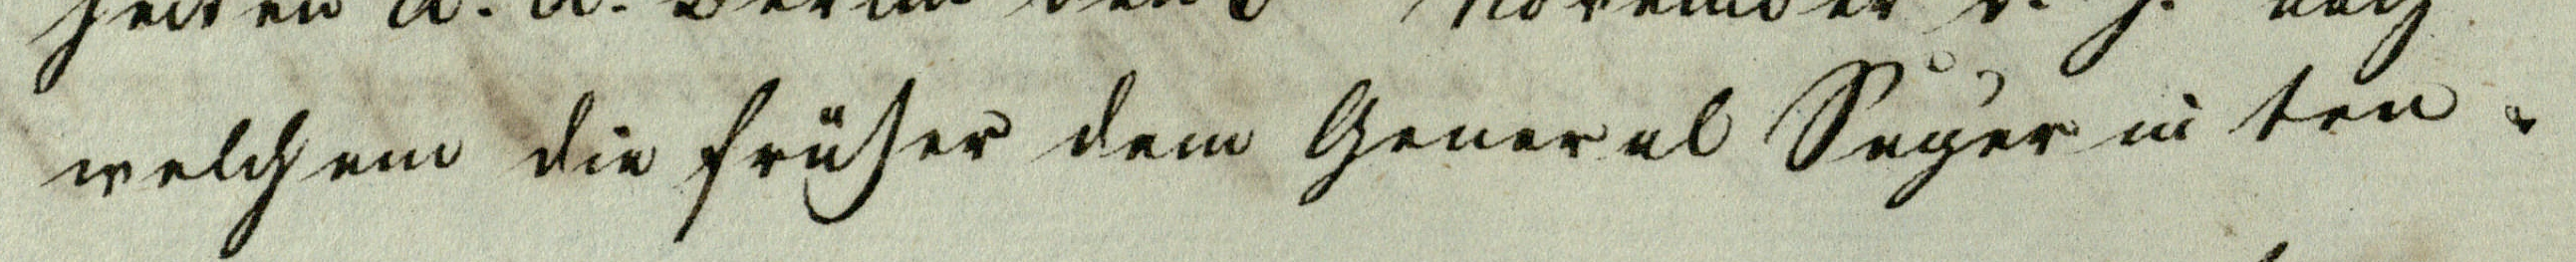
welchem die früher dem General Superinten¬
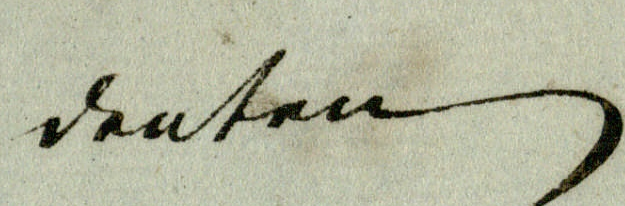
denten
